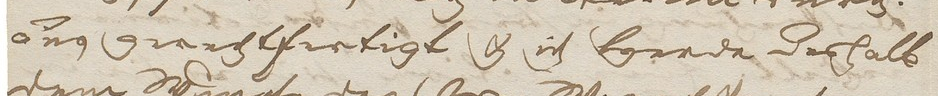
aus gerechtfertigt & ich werde deshalb
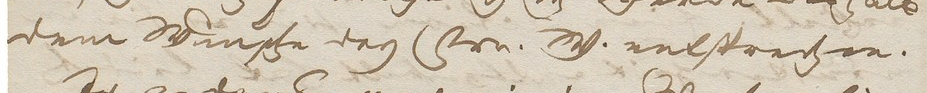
dem Wunsche des Hrn. W. entsprechen.
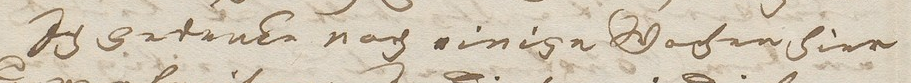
Ich gedenke noch einige Wochen hier
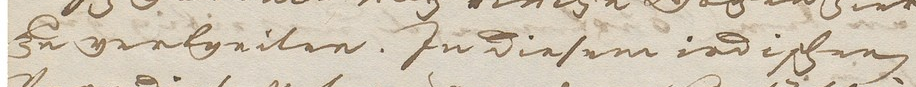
zu verweilen. In diesem irdischen
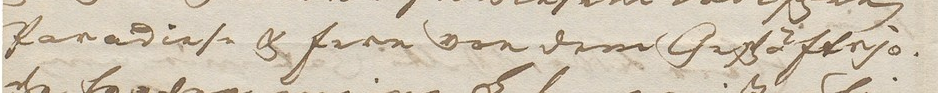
Paradiese & fern von dem Geschäftsjo-
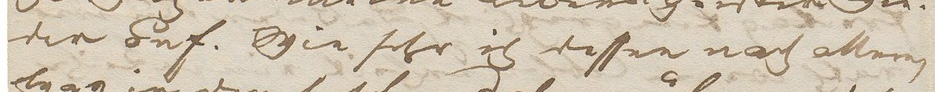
der auf. Wie sehr ich dessen nach allem,
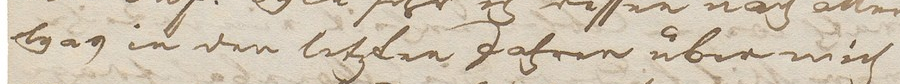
was in den letzten Jahren über mich
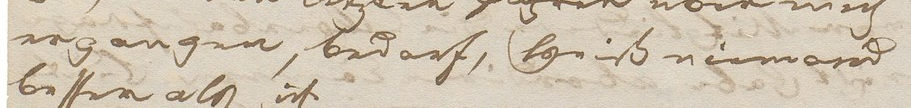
ergangen, bedarf, weiß niemand
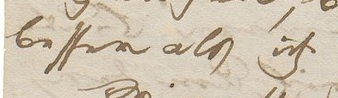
besser als ich.
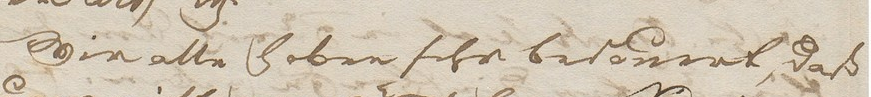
Wir alle haben sehr bedauert, daß
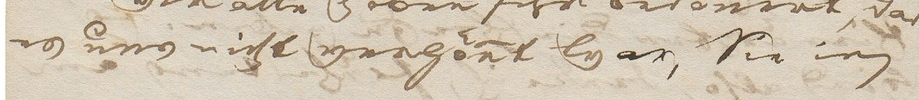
es uns nicht vergönnt war, Sie in
